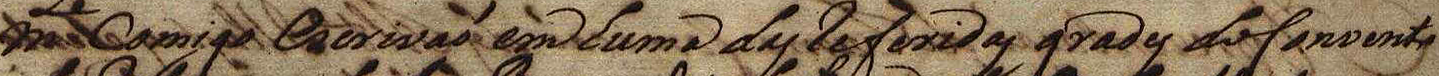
m.te comigo Escrivaõ em huma das Referidas grades do Convento
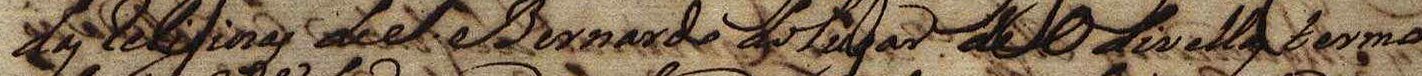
das Religiozas de S. Bernardo do Lugar de Odivellas termo
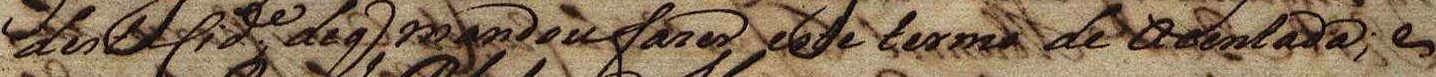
desta Cid.e de q̄ mandou fazer este termo de acentada; e
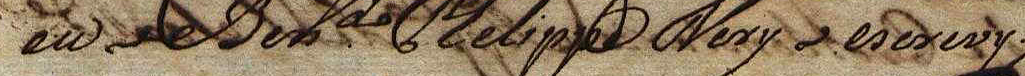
eu o Ben.do Phelippe Nery o escrevy.
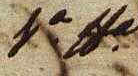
1a. tt.a
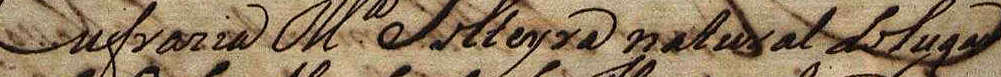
Eufrazia M.a Solteyra natural do lugar
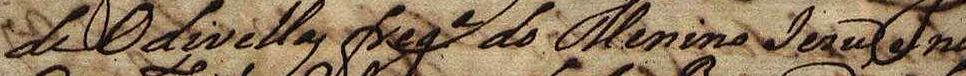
de Odivellas freg.a do Menino Jezu e no
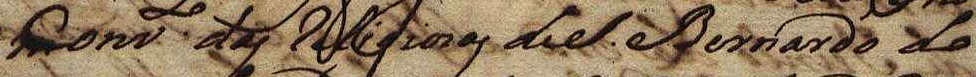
Conv.to das Religiozas de S. Bernardo do
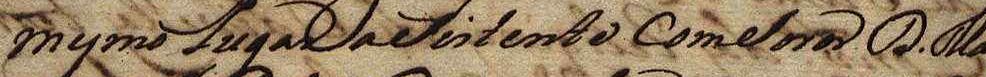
mesmo lugar aSistente com Soror D. Ma
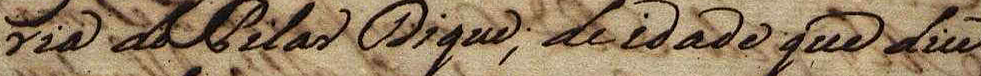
ria do Pilar Dique; de idade que dice
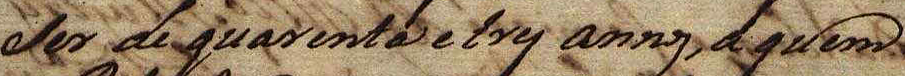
ser de quarenta e tres annos, a quem o
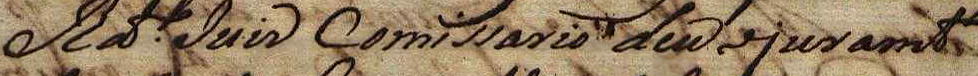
Rd.o Iuiz comissario deu o juramt.o
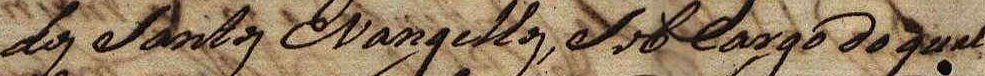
dos Santos Evangelhos, Sob cargo do qual
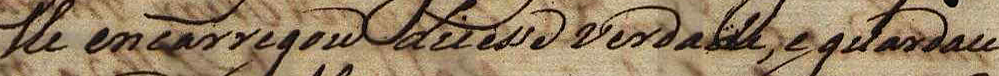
lhe encarregou dicesse verdade, e guardace
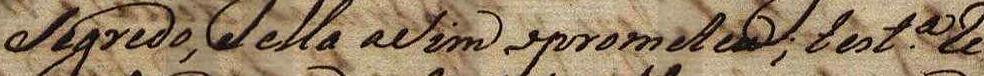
Segredo, e ella aSim o prometeu; test.a Re
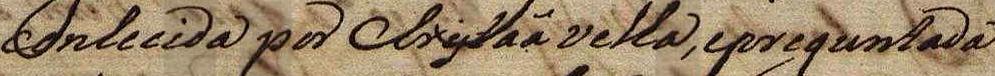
conhecida por christaã velha, e preguntada
